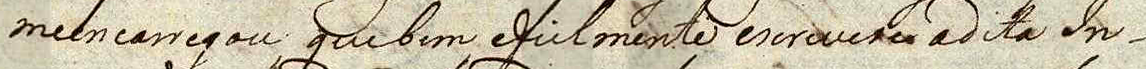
me encarregou; que bem e fielmente escreveo a dita In
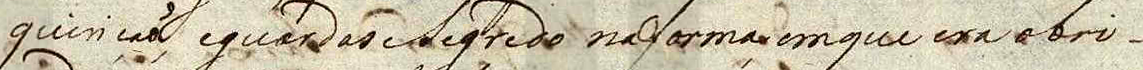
quisiçaõ; e guardar Segredo na forma em que era obri
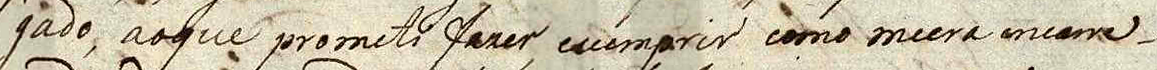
gado, ao que prometi fazer e cumprir como me era encarre
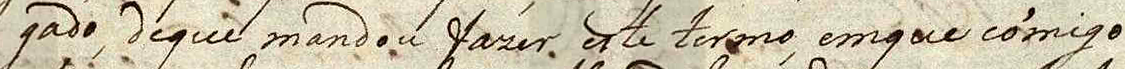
gado de que mandou fazer este termo em que cōmigo
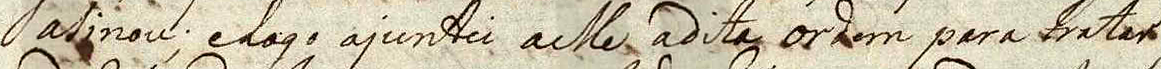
asinou; e logo ajuntei a elle a dita ordem para tratar
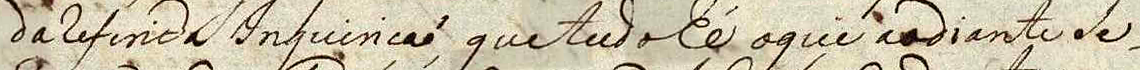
da Referida Inquisiçaõ que tudo Hé o que o adiante se
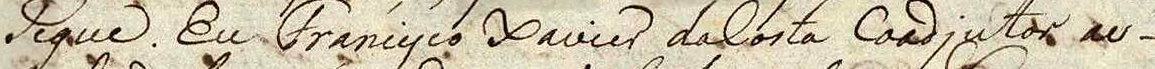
gue. Eu Francisco Xavier da Costa Coadjutor ac
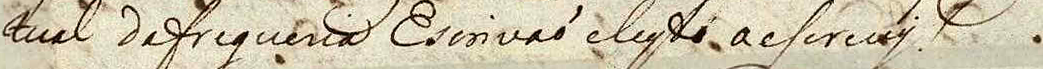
tual da freguesia Escrivaõ eleyto a escrevy.
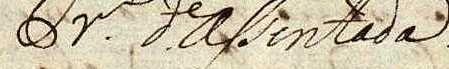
Tr.o de Assentada
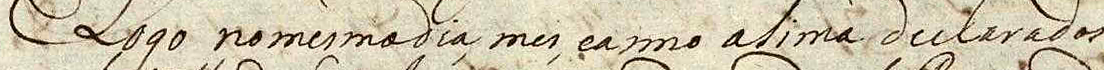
E Logo no mesmo dia mes e anno asima declarados
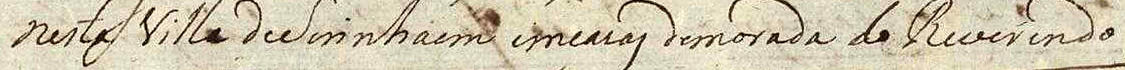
nesta Villa de Serinhaem em casas de morada do Reverendo
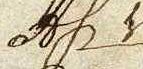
Ass. 1
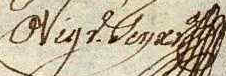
O Vigr.o Teyxr.a
